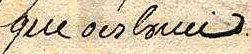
que o esCreui
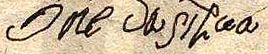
Joze da Silua
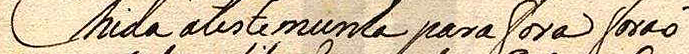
E hida a testemunha para fora foraõ
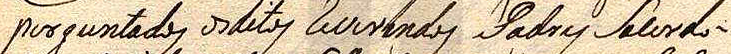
perguntados os ditos Reverendos Padres Sacerdo
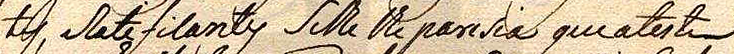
tes, e Rateficantes se lhe lhe paresia que a teste
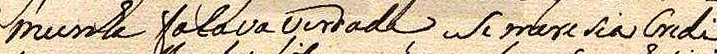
munha falava verdade e se meresia Credi
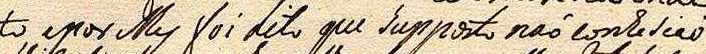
to, e por elles foi dito que supposto naõ conhesiaõ
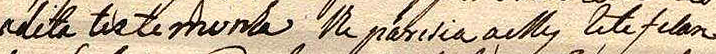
a dita testemunha lhe paresia a elles Retefican
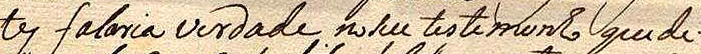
tes falaria verdade no seu testemunho que di
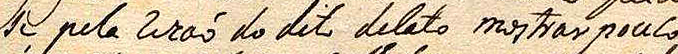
se, pela Rezaõ do dito delato mostrar pouco
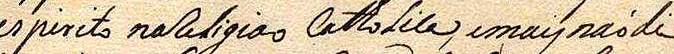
espirito na Religiao Catholica, e mais naõ di
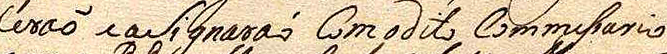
ceraõ e asignaraõ Com o dito Commissario
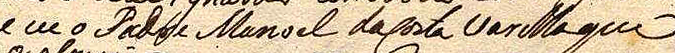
e eu o Padre Manoel da Costa Varella que
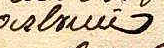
o esCreui
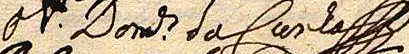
o P.e Dom.os da Cunha
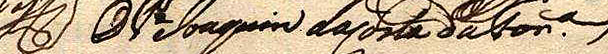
O Pe Joaquim da Costa da Fon.ca
